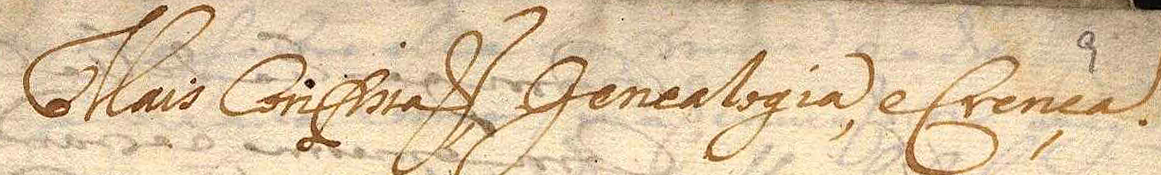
Mais Confissaõ Genealogia, e Crença.
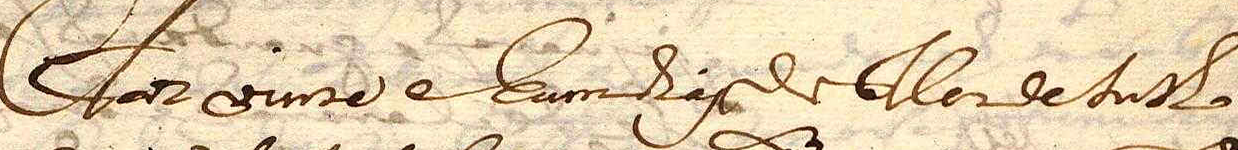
Aos vinte e hum dias do Mez de Iulho
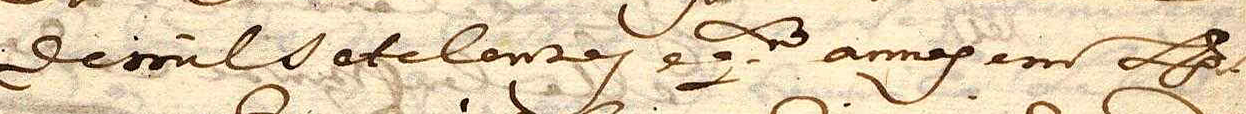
de mil seteCentos e q.tro annos em Lx.a
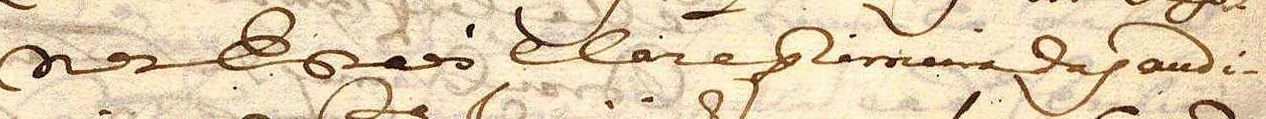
nos Estaos e Caza primeira das audi
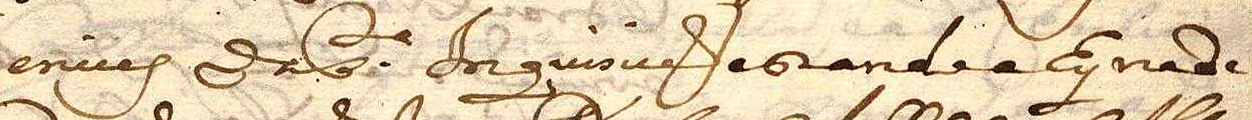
encias da s.ta Inquisiçaõ estando ahy na de
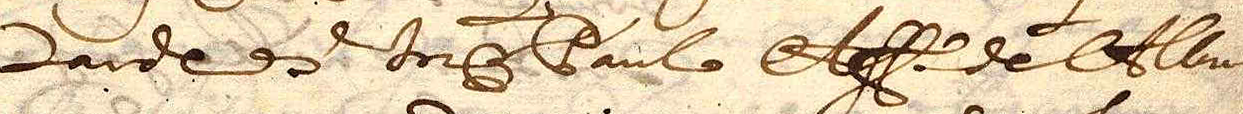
tarde o sr Inqr Paulo Aff.o de Albu
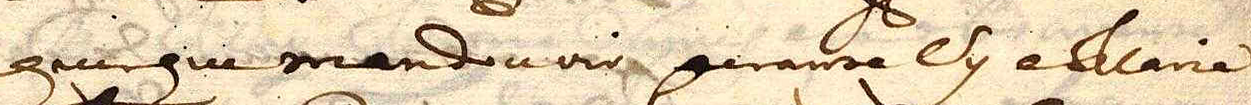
querque mandou vir perante Sy a Maria
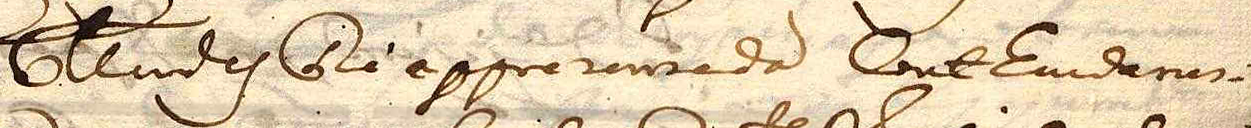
Mendes Ré apprezentada Contheuda nes
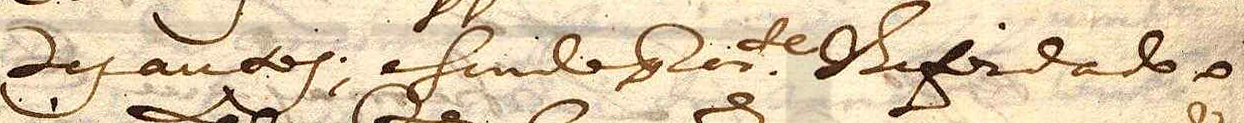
tes autos; e sendo prez.te lhe foi dado o
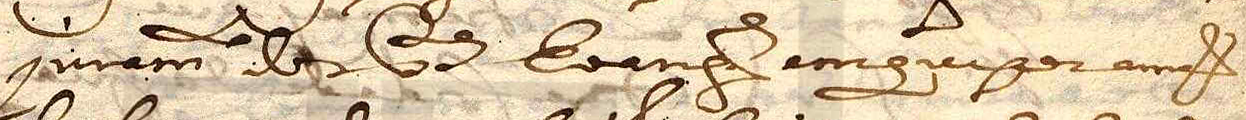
juramto dos stos Evangos em que poz a maõ
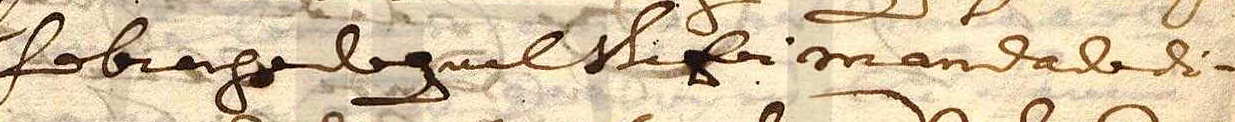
sob cargo do qual lhe foi mandado di
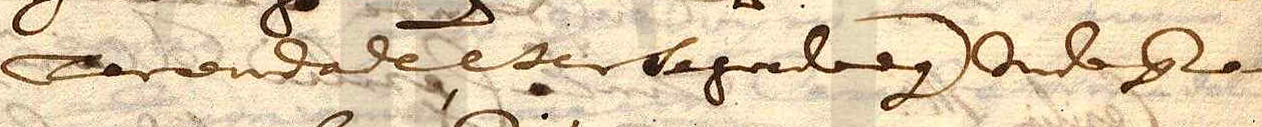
zer verdade, e ter segredo o q̄ tudo pro
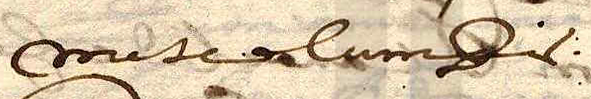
meteo cumprir.
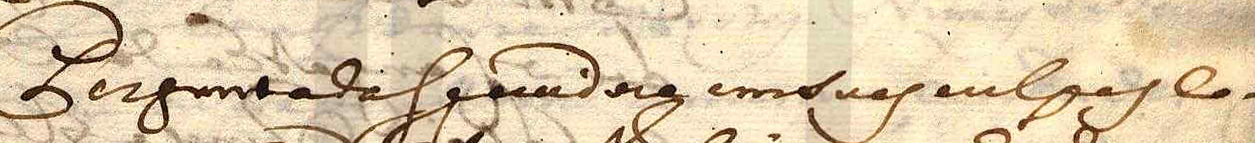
Perguntada se cuidara em suas culpas co
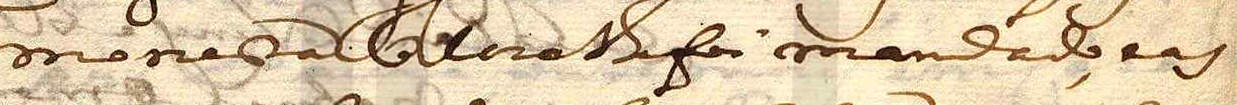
mo nesta Meza lhe foi mandado, e as
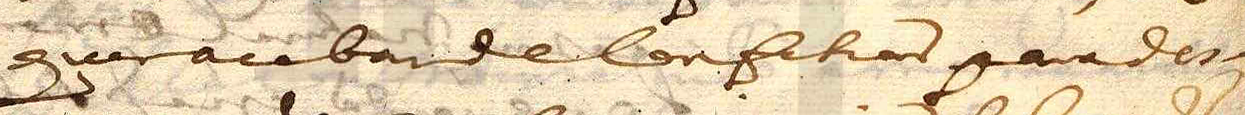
quer acabar de Confessar para des
